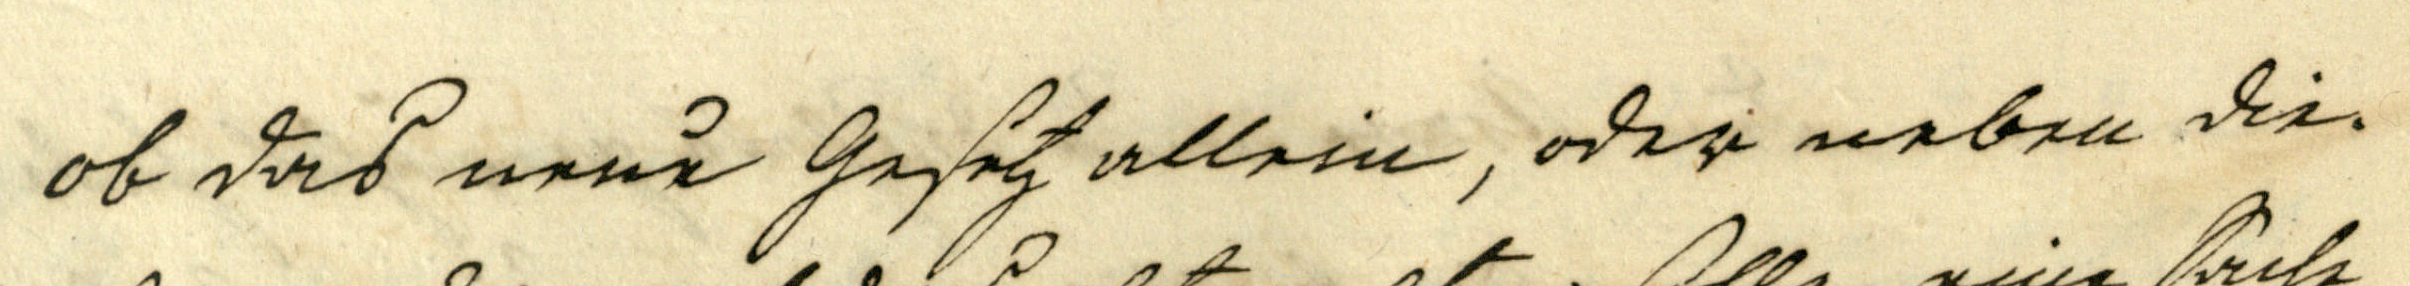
ob das neue Gesetz allein, oder neben die¬
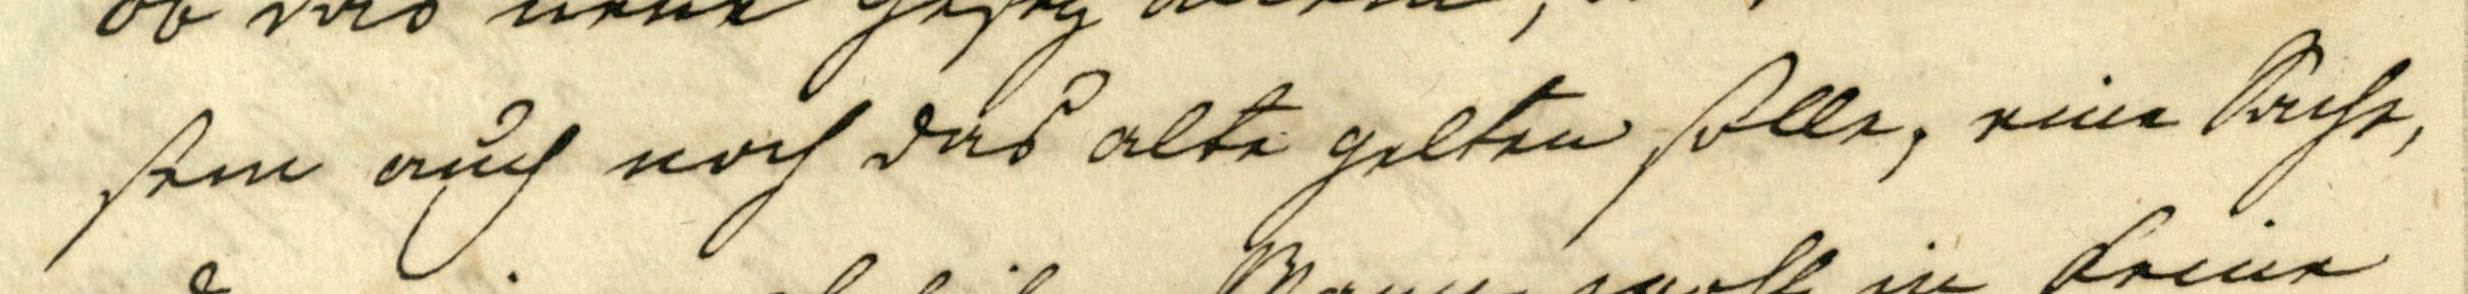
sem auch noch das alte gelten solle, eine Sache,
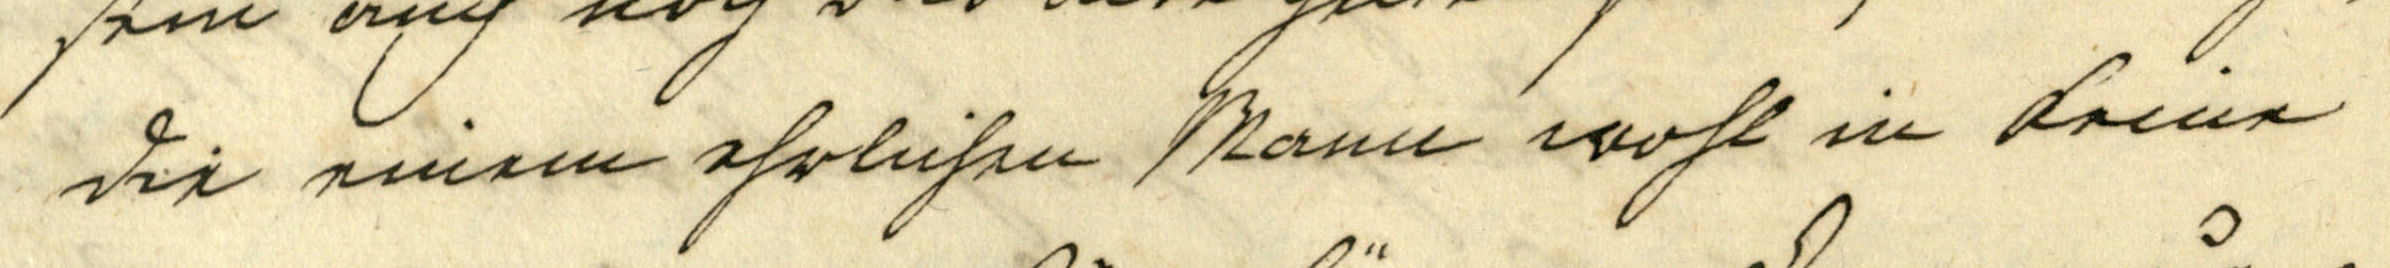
die einem ehrlichen Mann wohl in keine
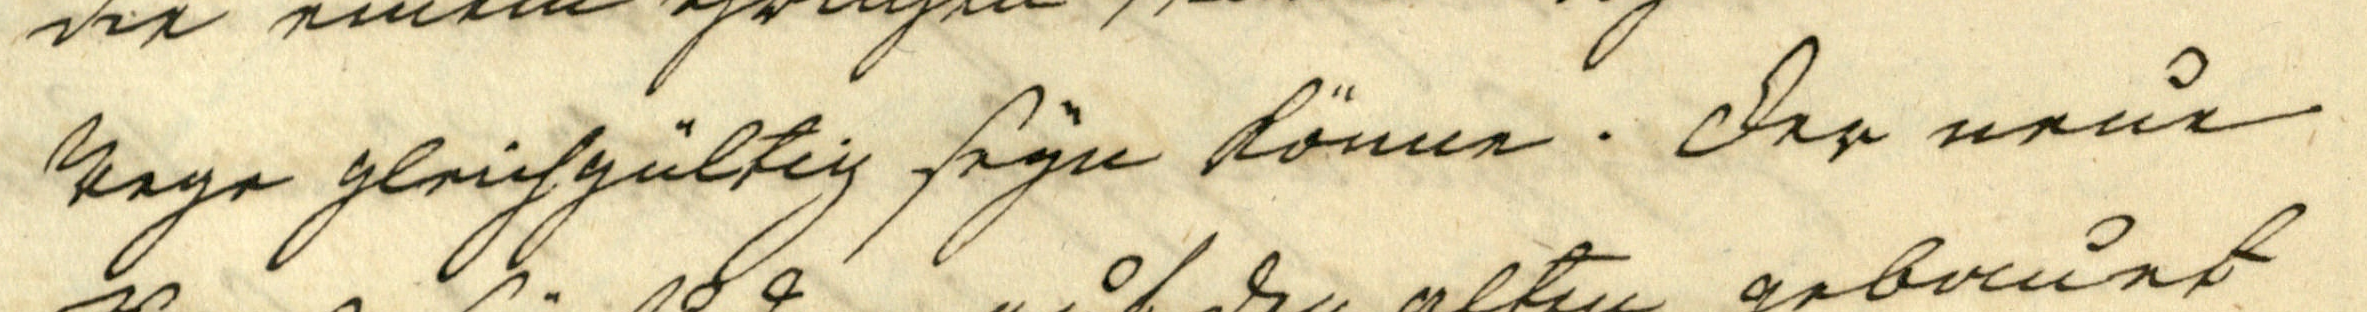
Wege gleichgültig seÿn könne. Der neue
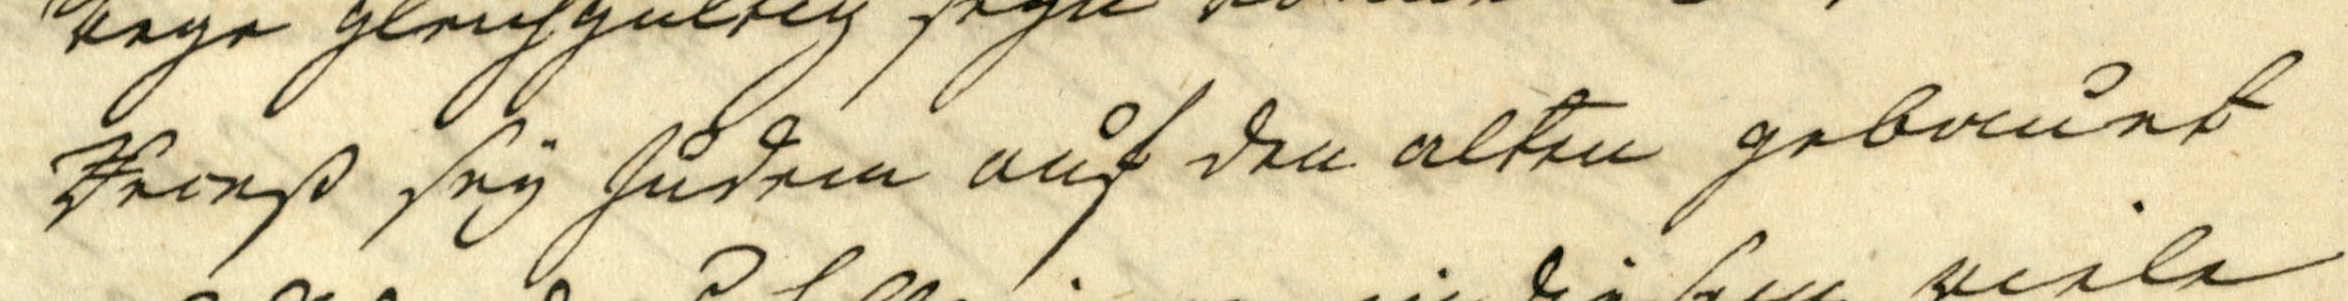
Receß seÿ zudem auf den alten gebauet
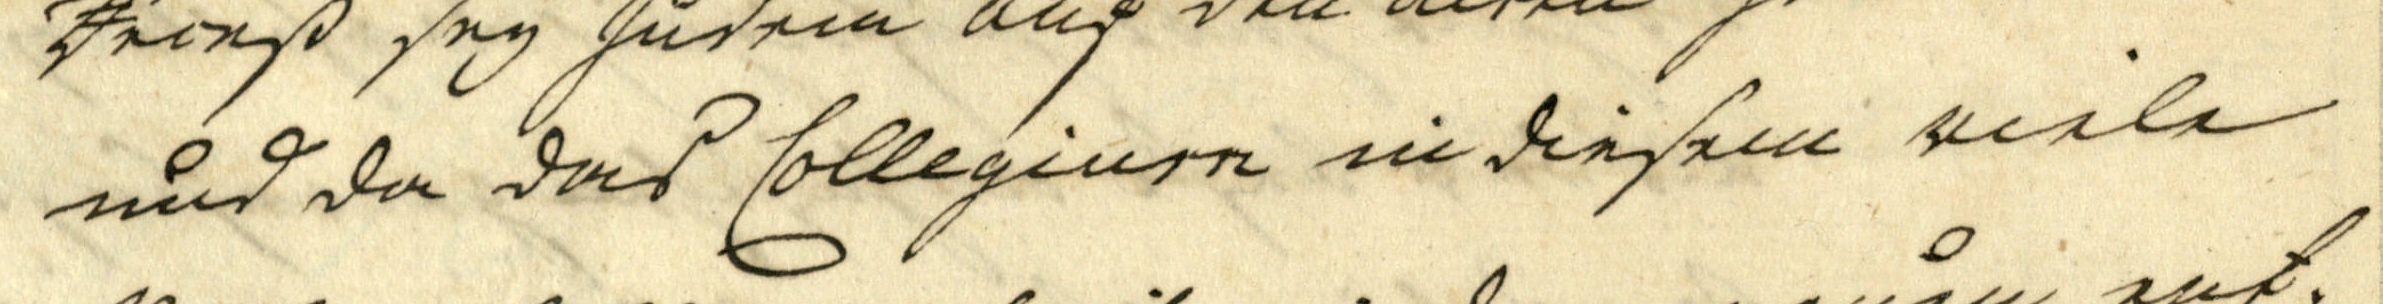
und da das Collegium in diesem viele
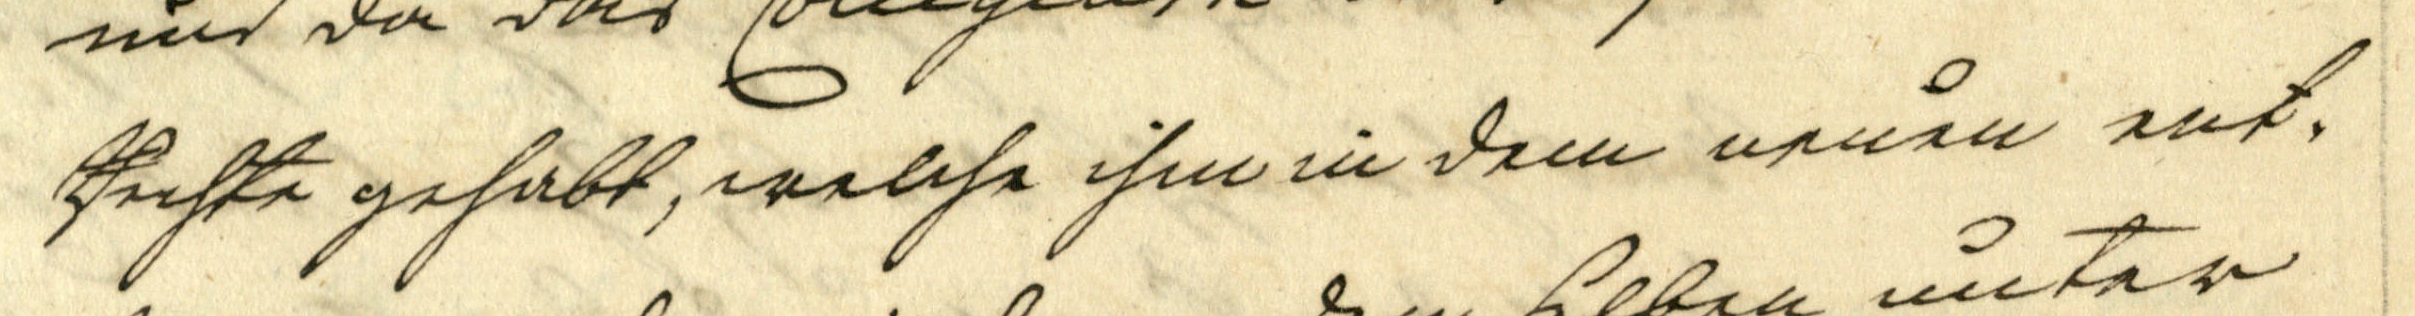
Rechte gehabt, welche ihm in dem neuen ent¬
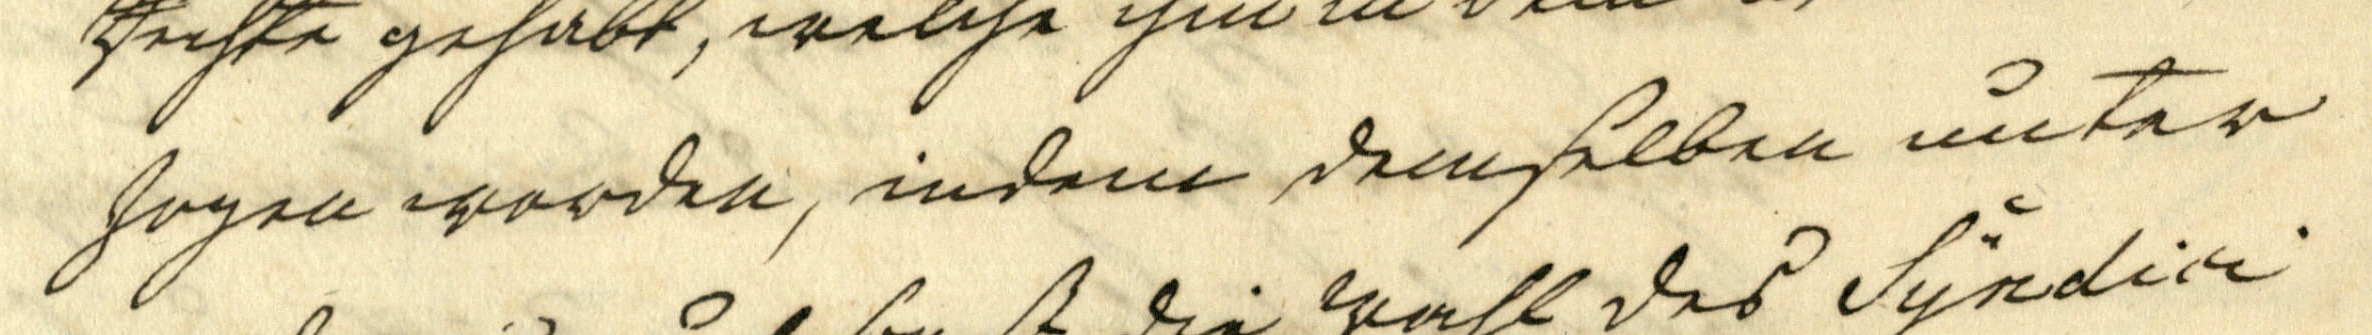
zogen worden, indem demselben unter
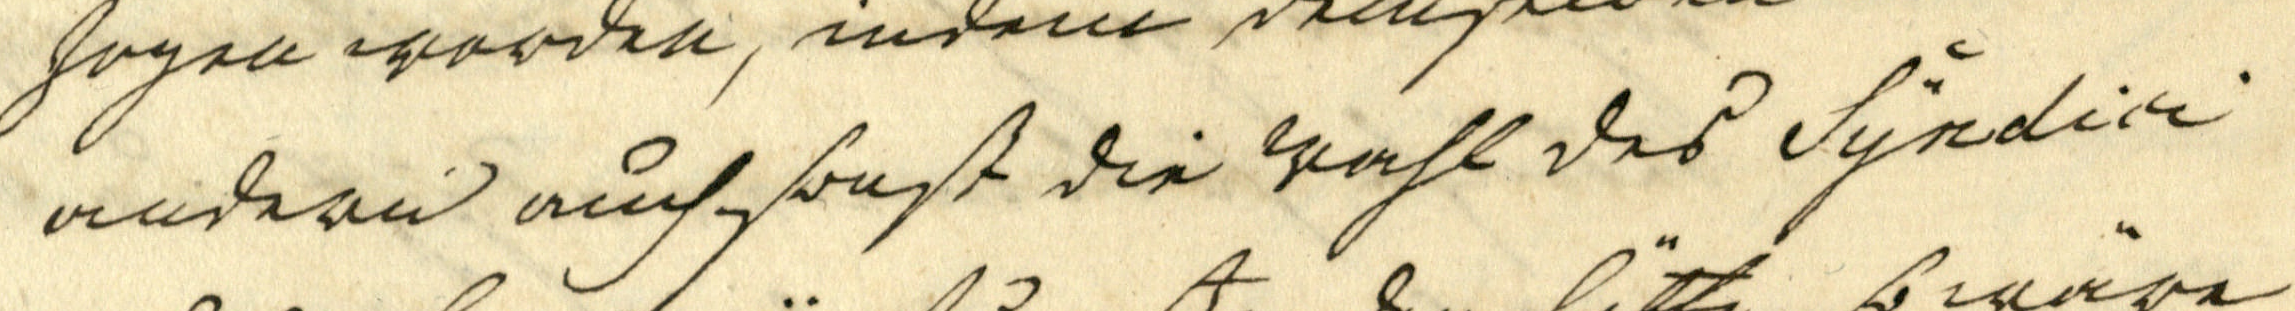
andern auch sonst die Wahl des Sÿndici
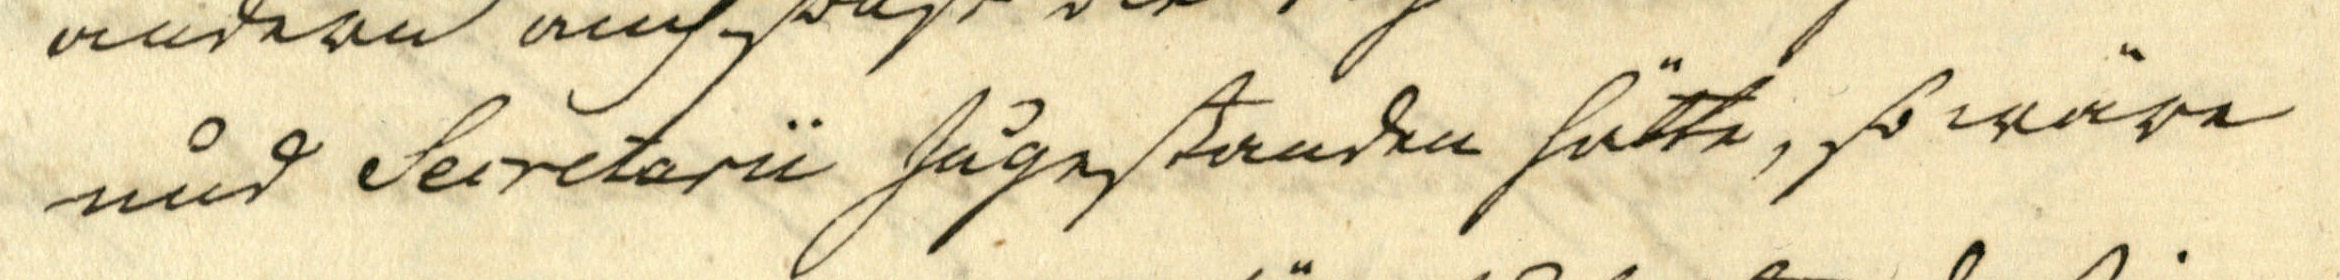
und Secretarii zugestanden hätte, so wäre
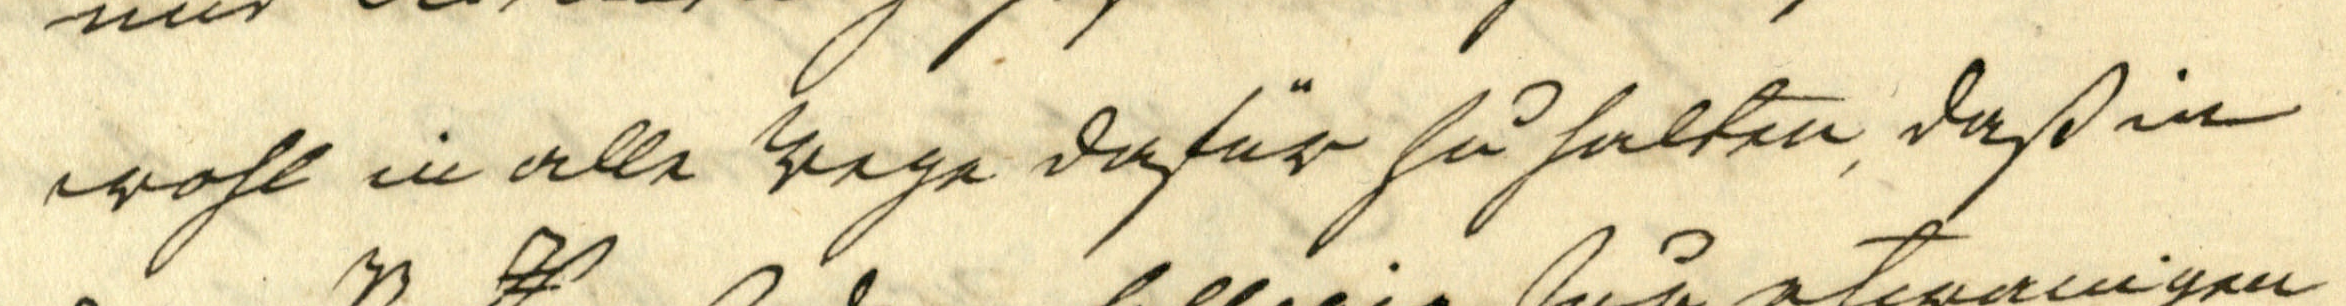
wohl in alle Wege dafür zu halten, daß in
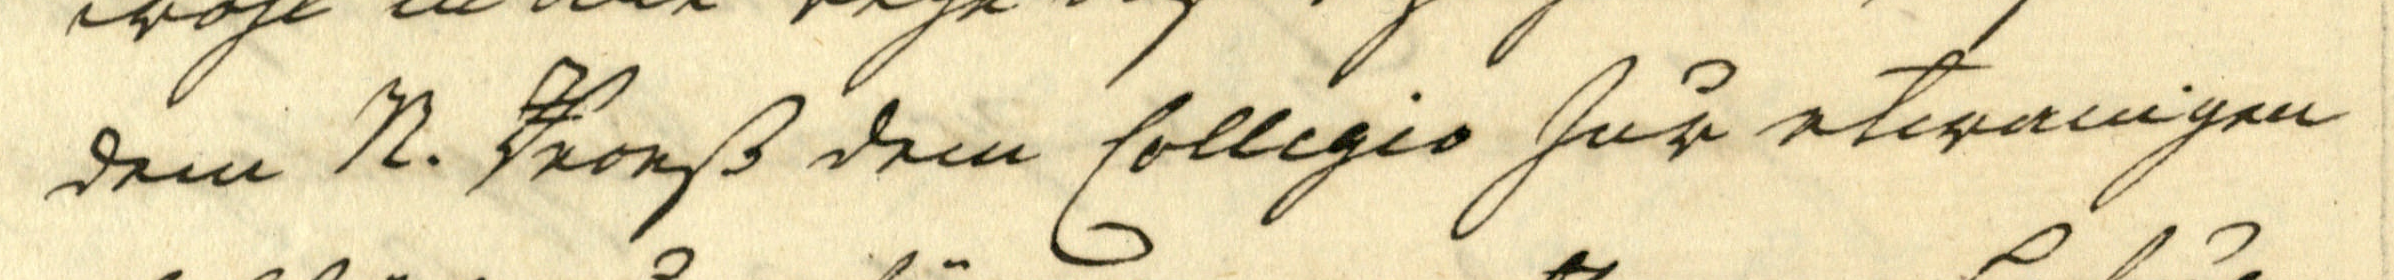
dem N. Receß dem Collegio zur etwanigen
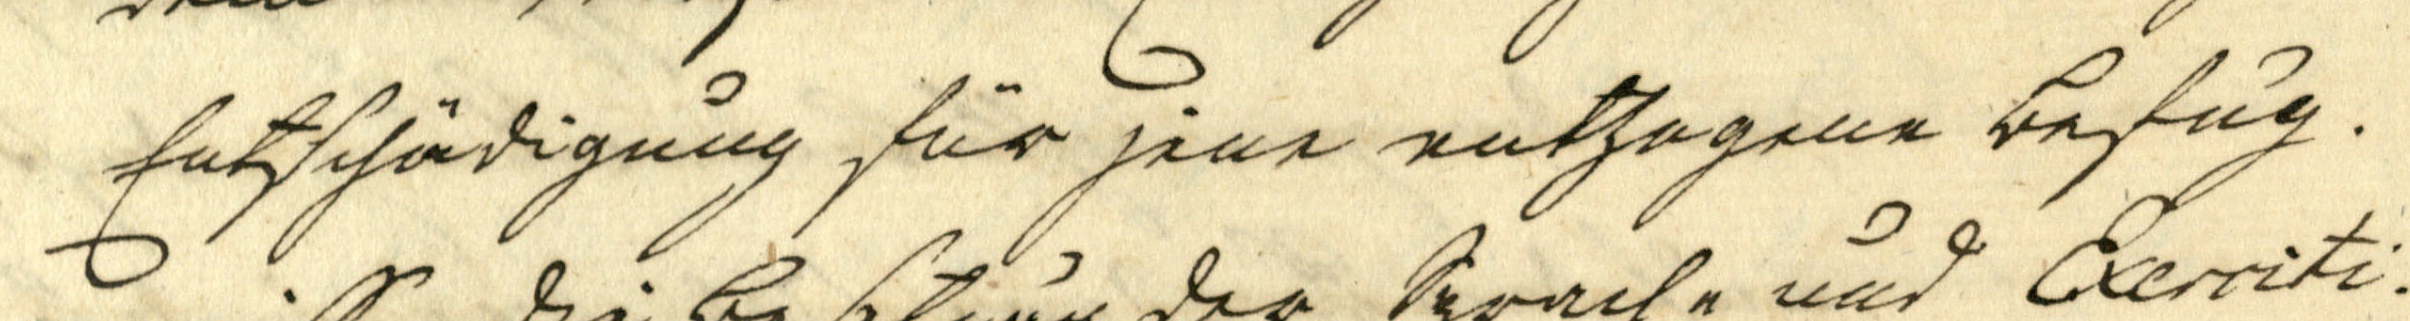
Entschädigung für jene entzogene Befug¬
